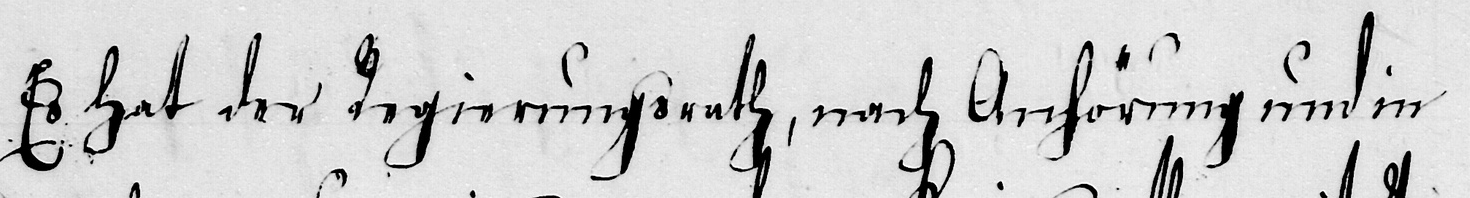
Es hat der Regierungsrath, nach Anhörung und in
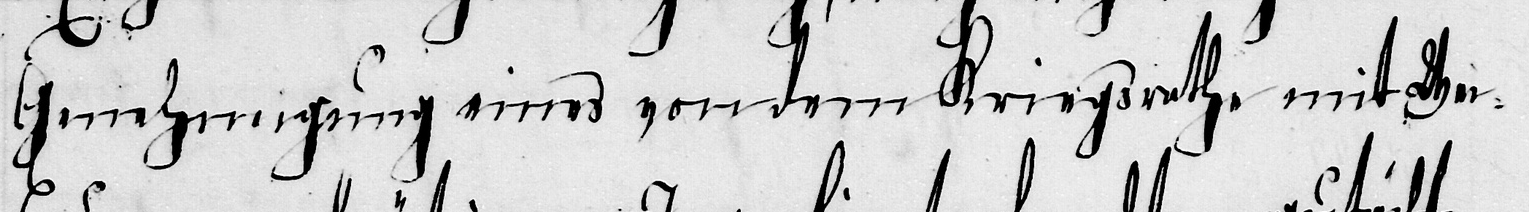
Genehmigung eines von dem Kriegsrathe mit Wei¬
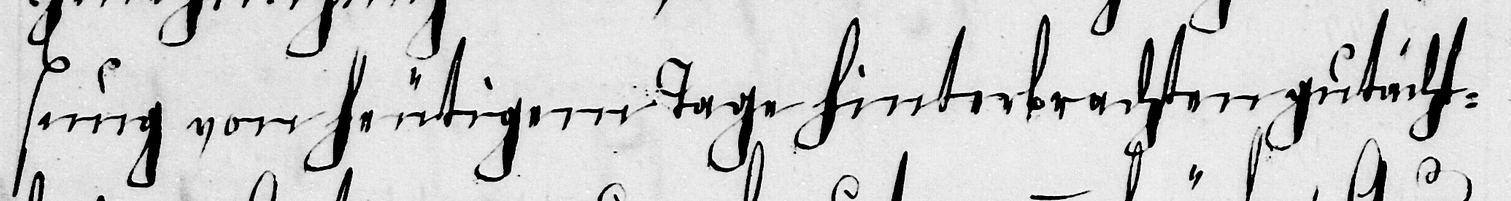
sung von heutigem Tage hinterbrachten gutächt¬
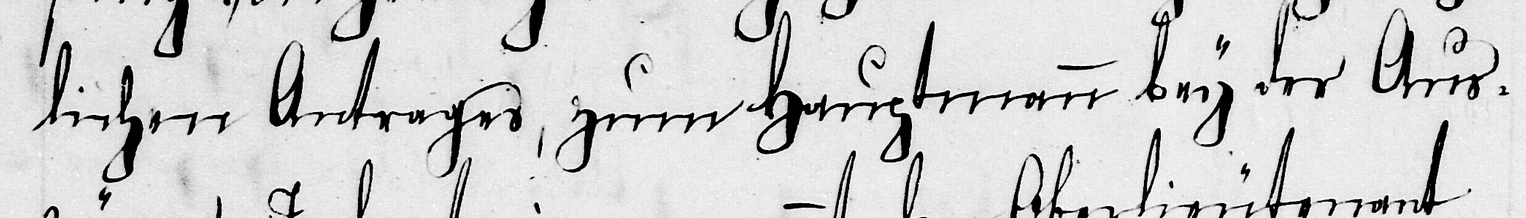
lichen Antrages, zum Hauptmann bey der Aus¬
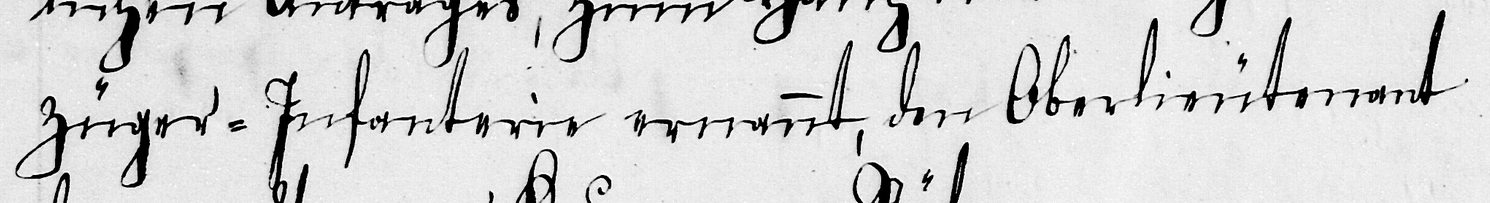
züger-Infanterie ernannt, den Oberlieutenant
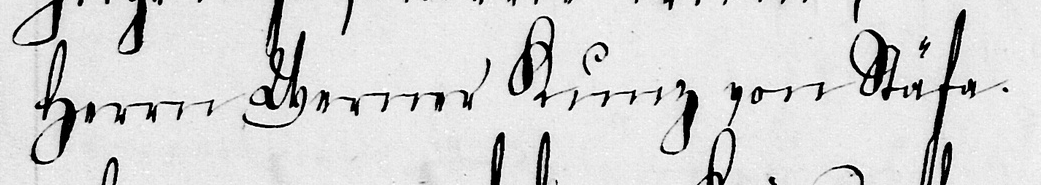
Herrn Werner Kunz von Stäfa.
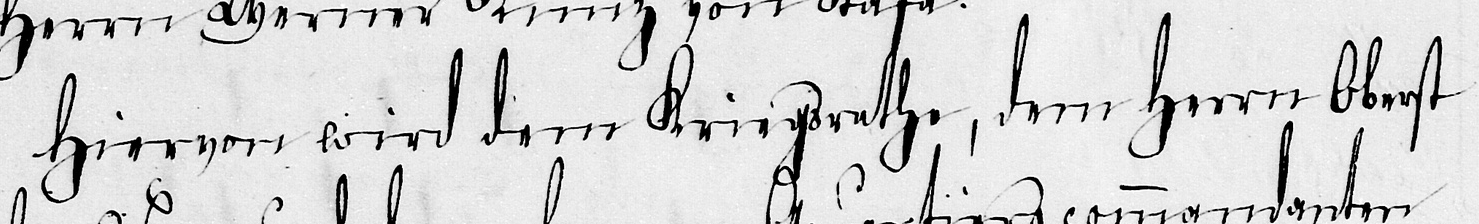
Hiervon wird dem Kriegsrathe, dem Herrn Oberst
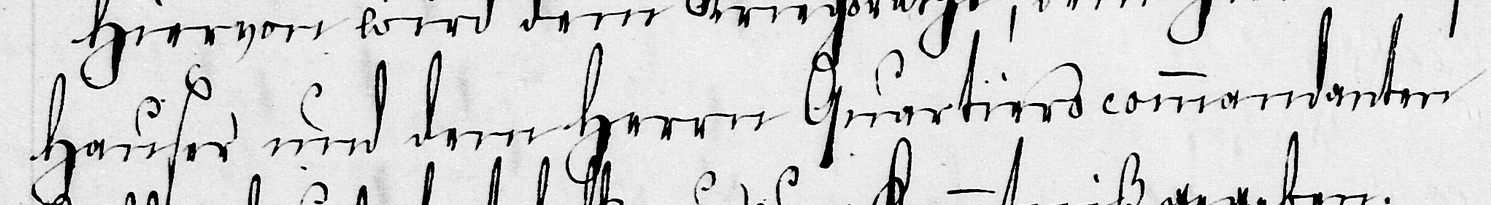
Hauser und dem Herrn Quartierscommandanten
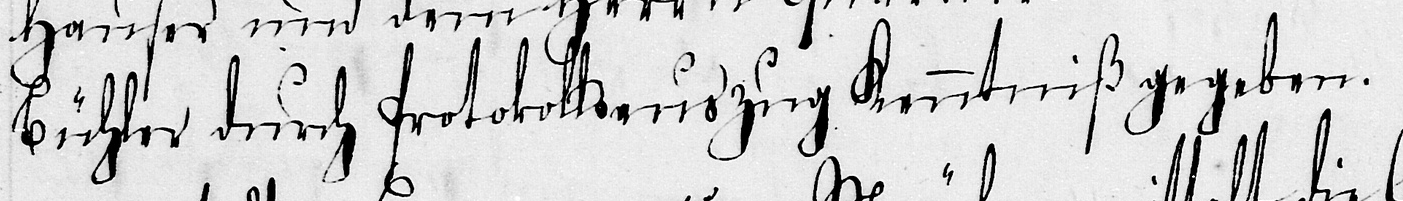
Bühler durch Protokollsauszug Kenntniß gegeben.
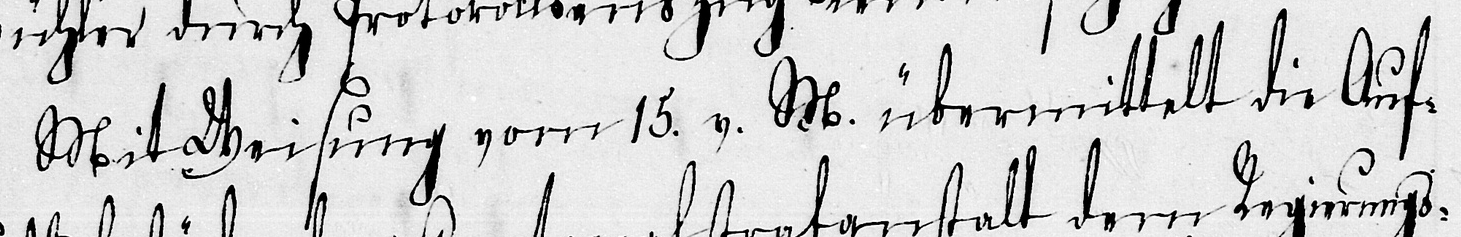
Mit Weisung vom 15. v. M. übermittelt die Auf¬
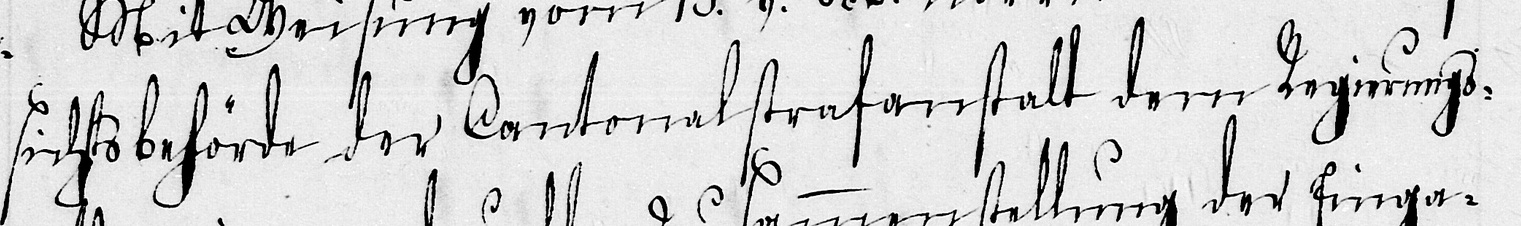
sichtsbehörde der Cantonalstrafanstalt dem Regierungs¬
